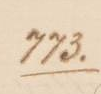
1875.
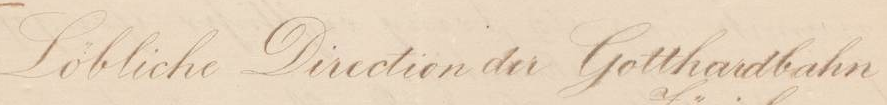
Löbliche Direction der Gotthardbahn
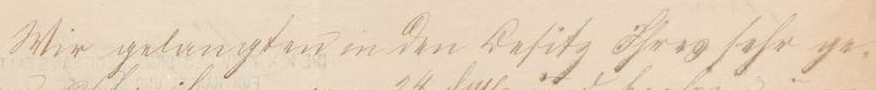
Wir gelangten in den Besitz Ihres sehr ge-
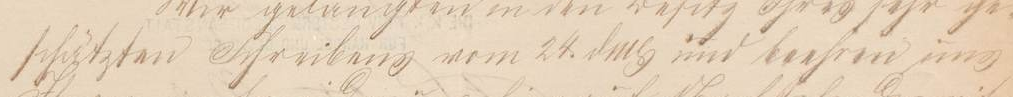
schätzten Schreibens vom 24 dMts und beehren uns
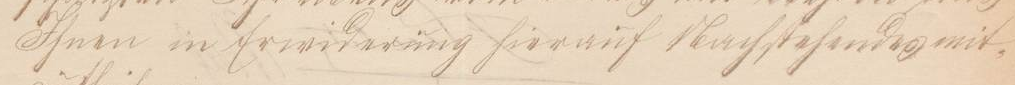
Ihnen in Erwiderung hierauf Nachstehendes mit-
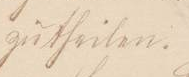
zutheilen.
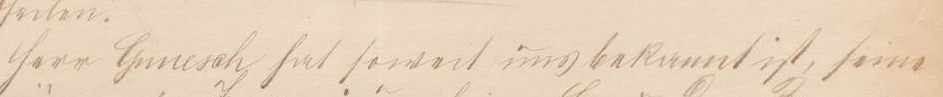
Herr Gunesch hat soweit uns bekannt ist, seine
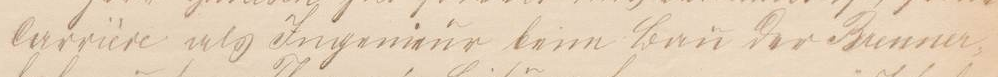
Carrière als Ingenieur beim Bau der Brenner -
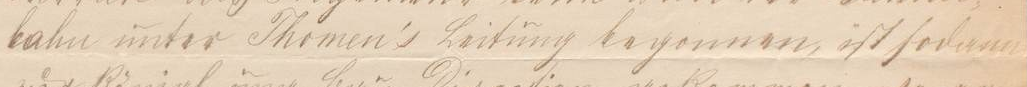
bahn unter Thomen's Leitung begonnen, ist sodann
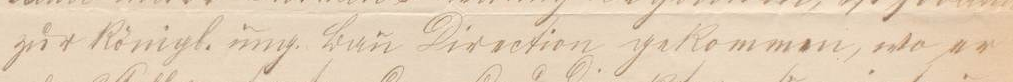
zur Königl. ung. Bau Direction gekommen, wo er
